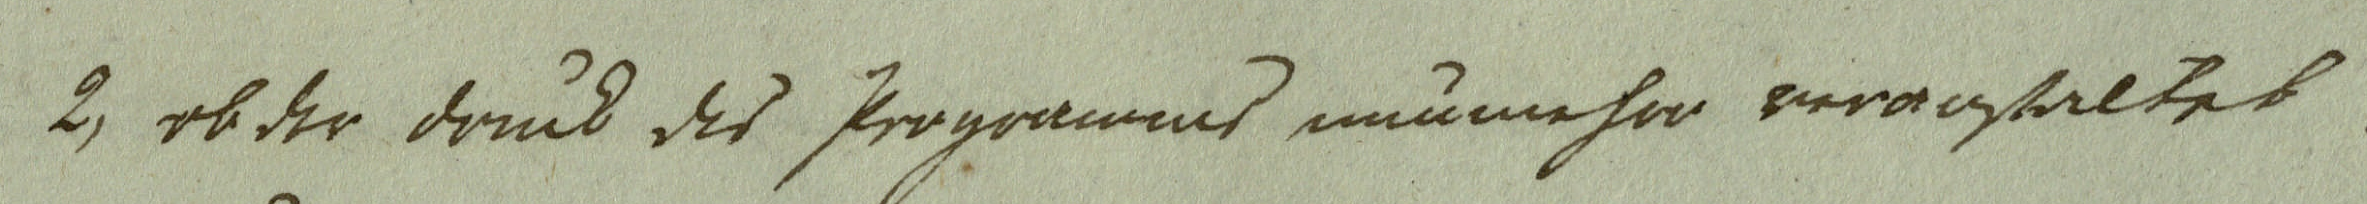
2, ob der Druck des Programms nunmehro veranstaltet
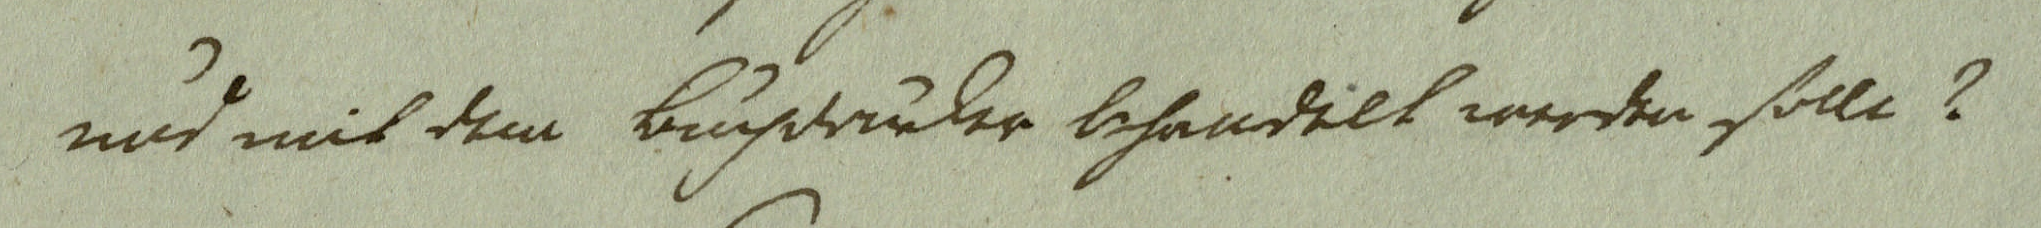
und mit dem Buchdrucker gehandelt werden solle?
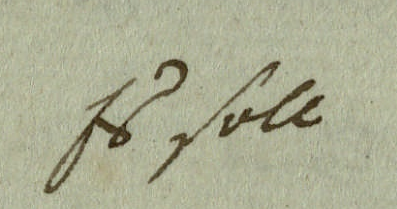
Es soll
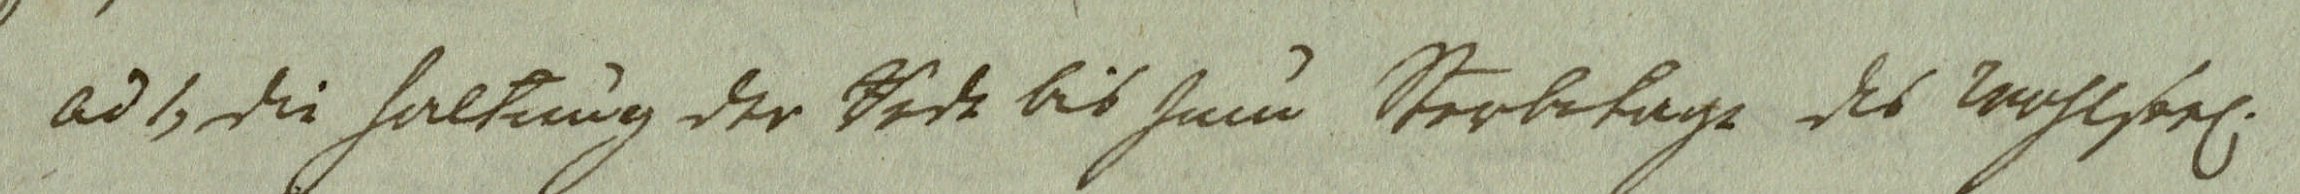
ad 1, die Haltung der Rede bis zum Sterbetage des Wohlseel.
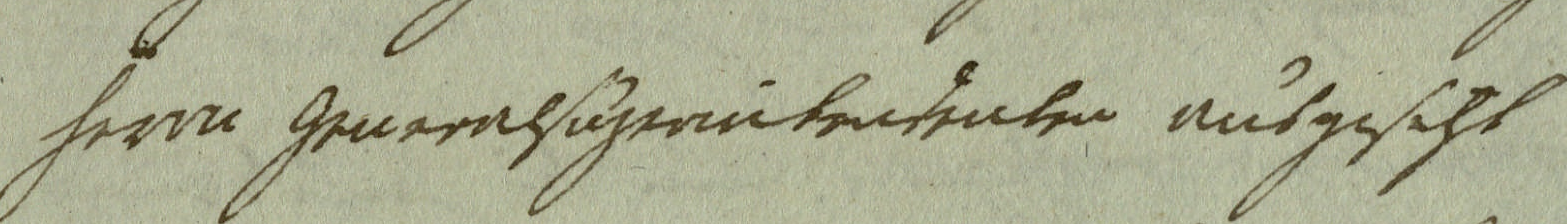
herrn Generalsuperintendenten ausgesetzt
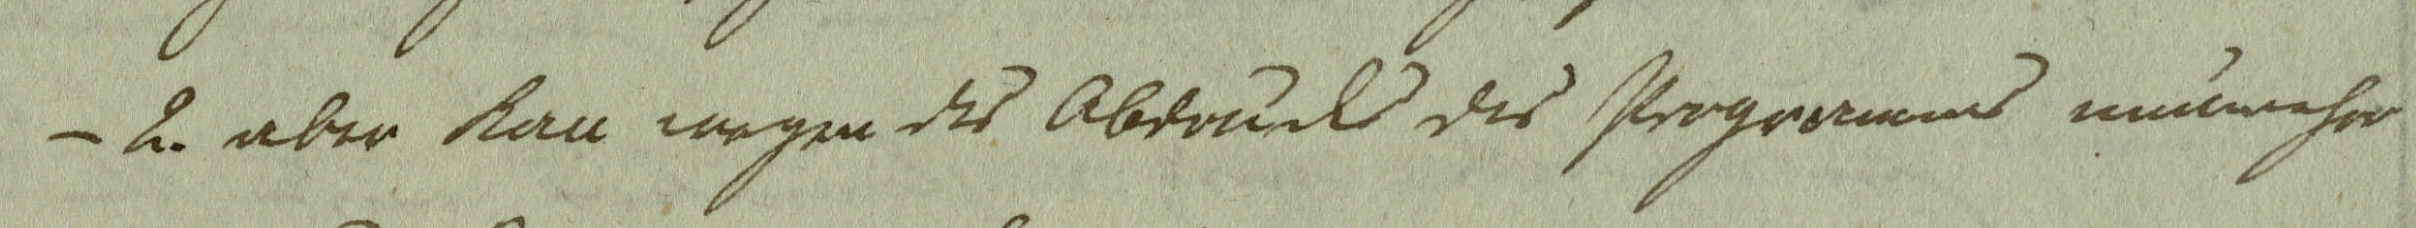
2, aber kan wegen des Abdrucks des Programms nunmehro
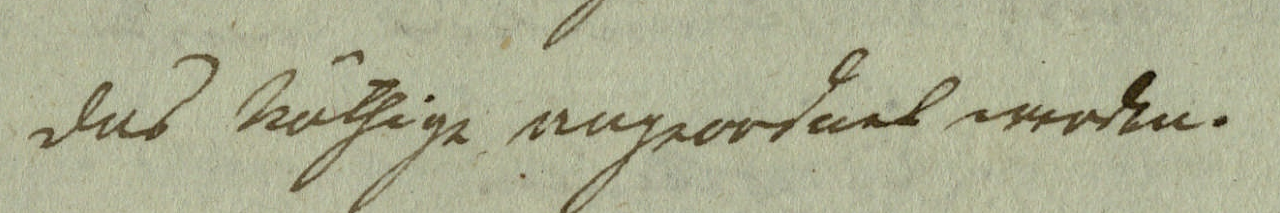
das Nöthige angeordnet werden.
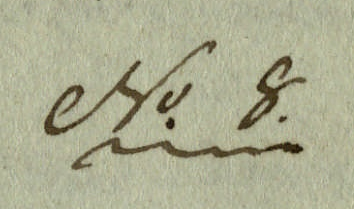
Nº 8.
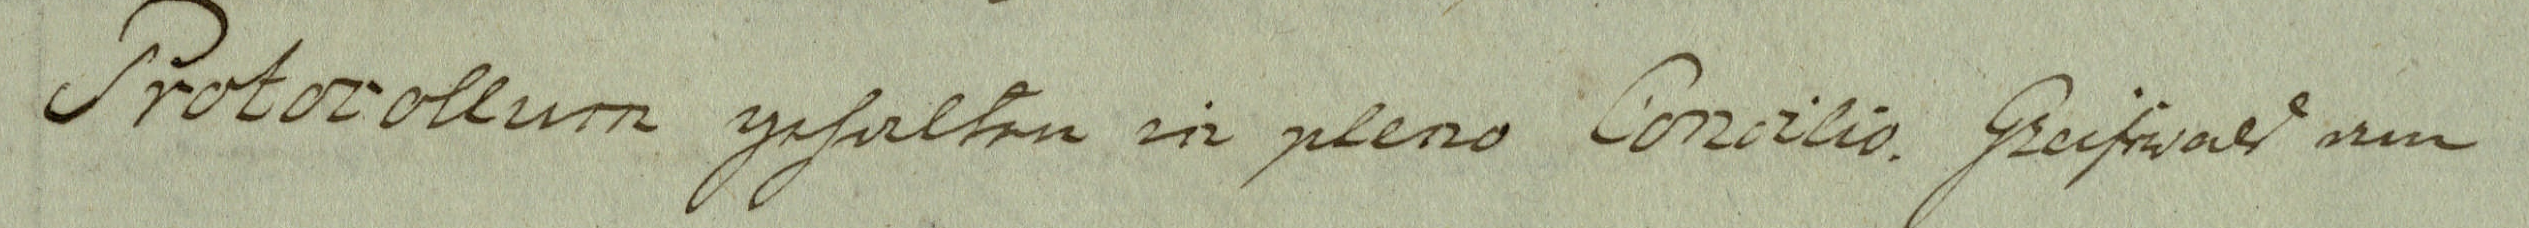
Protocollum gehalten in pleno Concilio. Greifswald am
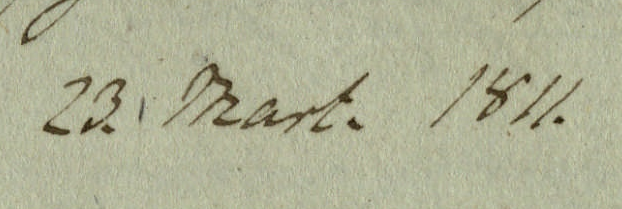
23. Mart. 1811
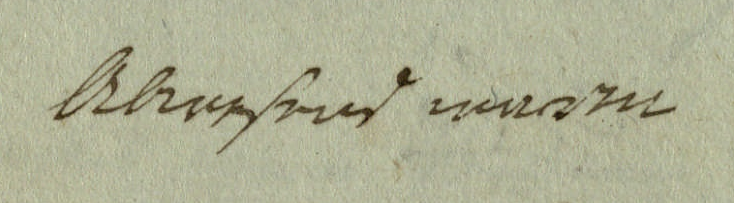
Abwesend waren
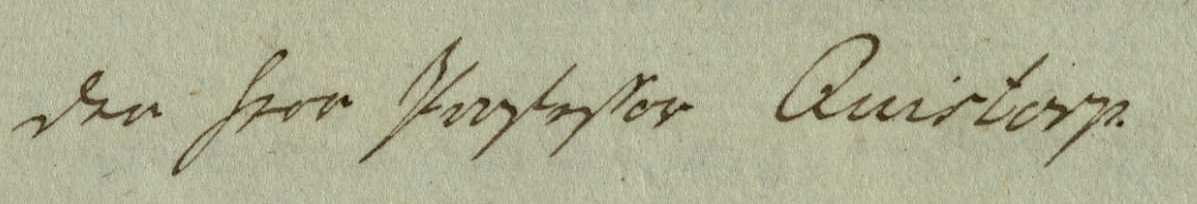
der herr Professor Quistorp.
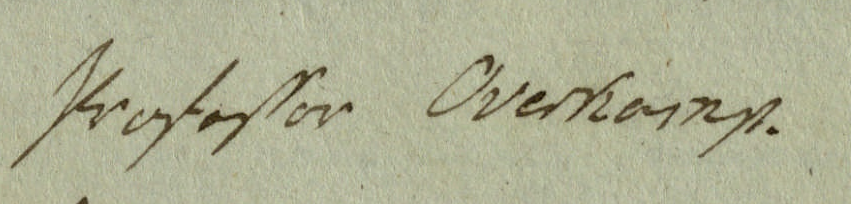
Professor Overkamp.
